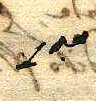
1a.
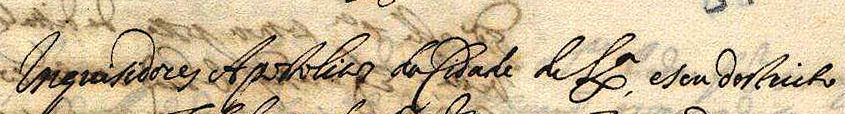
Inquisidores Apostolicos da Cidade de Lxa. e seu destricto
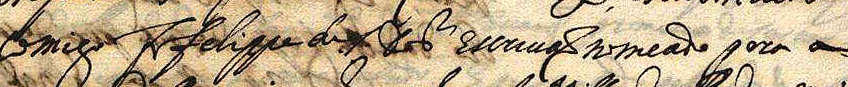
comigo fr felippe de S. Dos̄ Escriuaõ nomeado para a
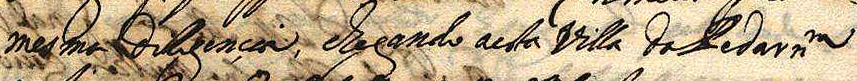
mesma diligencia, chegando a esta Villa da Pedarnra
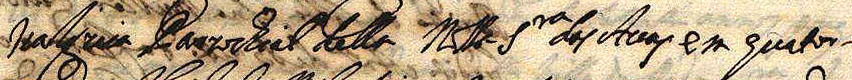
na Igreia Parrochial della nossa Sra das Areas em quator
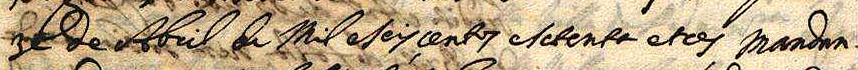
ze de Abril de mil e seiscentos e setenta e tres mandan
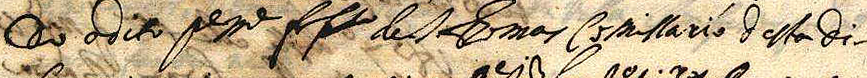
do o dito pe me fr frco de S. thomas Commissario desta di
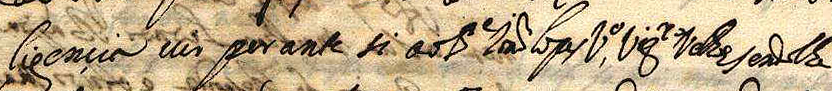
ligencia uir perante si ao Pe Ioaõ lopes Vo, Vigro velho sendolhe
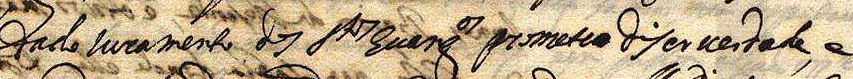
dado iuramento dos stos Euangos prometeo diser uerdade, e
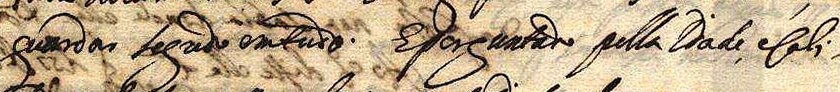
guardar segredo em tudo. E perguntado pella idade, e Cali
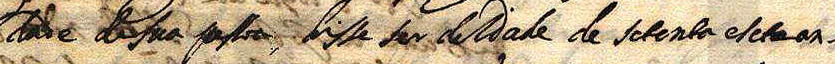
dade de sua pessoa, disse ser de Idade de setenta e sete an
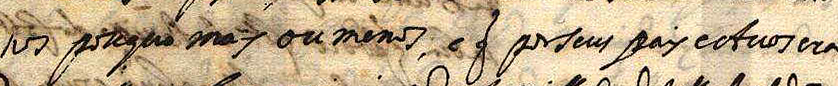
nos pouquo mais ou menos, e q̄ por seus pais e Auos era
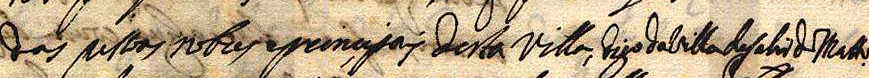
das pessoas nobres e principais desta Villa, digo da Villa de salir de Matto
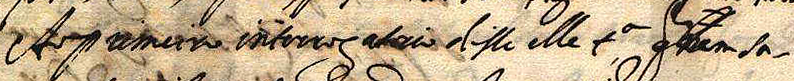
Ao primeiro interrogatorio disse elle ta, q̄ nam sa
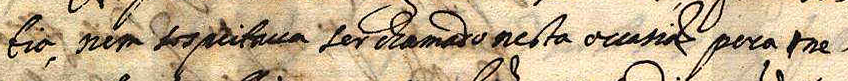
bia, nem sospeitaua ser chamado nesta occasiaõ pera ne
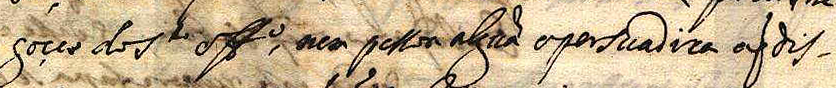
goceo do sto offo, nem pessoa alguā o persuadira a q̄ dis
